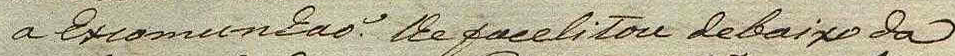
a Excomunhaõ lhe facelitou debaixo da
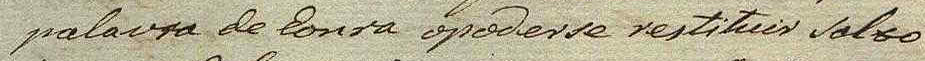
palavra de honra o poderse restituir solto
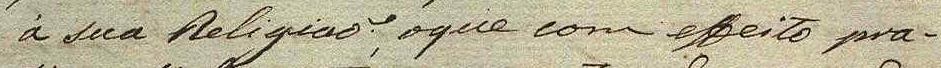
á sua Religiaõ o que com effeito pra
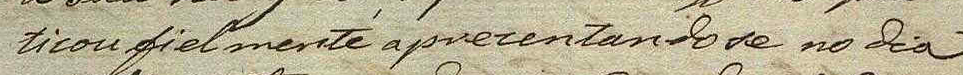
ticou fielmente aprezentandose no dia
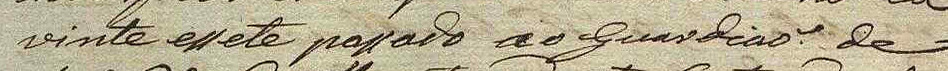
vinte e ssete passado ao Guardiaõ de
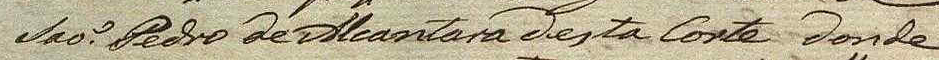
Saõ Pedro de Alcantara desta Corte donde
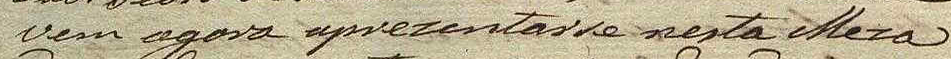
vem agora aprezentarse nesta Meza
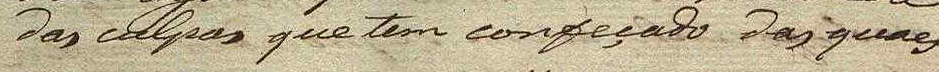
das culpas que tem confeçado das quaes
